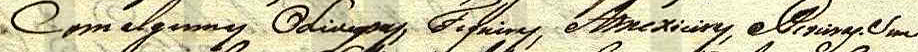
com algumas OLiveyras, Feguiras, Amexieiras, e Pereiras. Sem
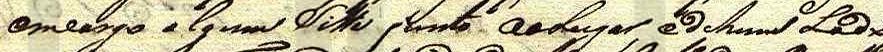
emcargo algum sitta junto ao Lugar, e de hum Lado
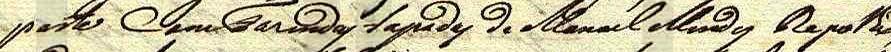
parte Com Fazendas tapadas de Manoel Mendes Repolho,
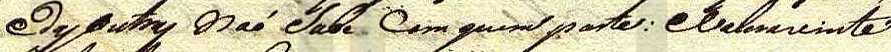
e das outras naõ sabe com quem parte: e valera vinte
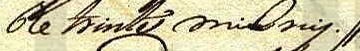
ou trinta mil reis.//
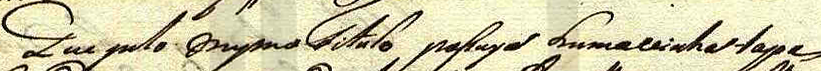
Que pelo mesmo Titulo possuya huma vinha tape
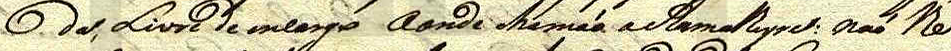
da, Livre de encargo aonde chamaõ a Ramalheyre: naõ lhe
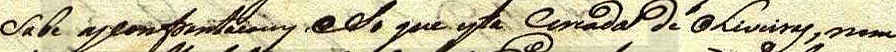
sabe as confrontacoens. e So que esta cercada de oLiveiras, nam
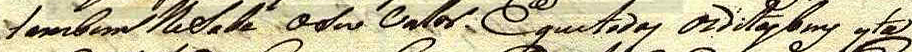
também lhe Sabe o Seu valor. E que todas os ditos bens esta
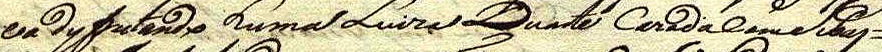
va desfrutando huma Luiza Duarte Cazada com Sebas
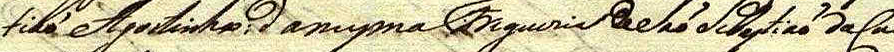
tiaõ Agostinho: da mesma Freguezia de Saõ Sebastiaõ da Cu
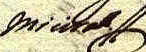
mieira. //
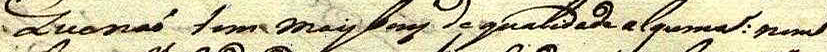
Que naõ tem mais bens de qualidade alguma: nem
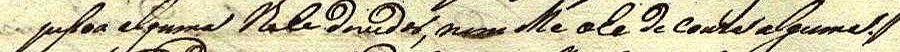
pessoa alguma lhe he devedor, nem elle o he de couza alguma.//
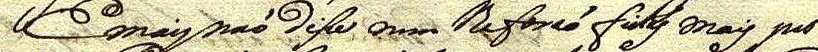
E mais naõ disse nem lhe foraõ feitas mais per
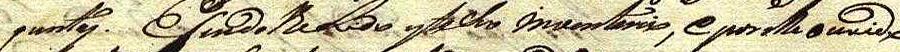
guntas. E sendo lhe Lido este seo inventario, e por elle ouvido
